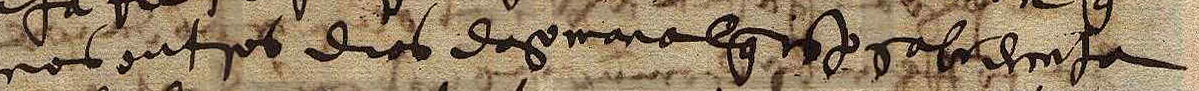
nos outros dias da somana e q̄ isto sabe de çerta
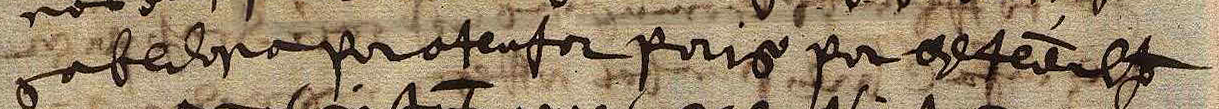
sabedoria por atentar por iso por lhe terē dito
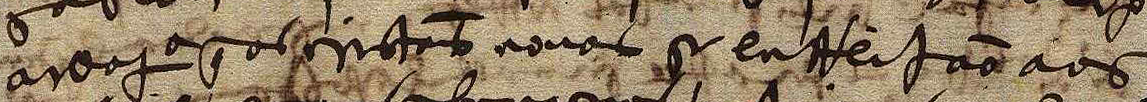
a ella ta q̄ os cristãos nouos se enffeitão aos
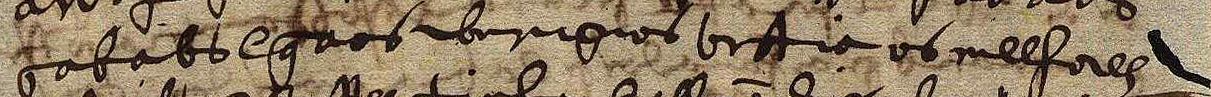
sabados e q̅ aos domjnguos vestia os melhores
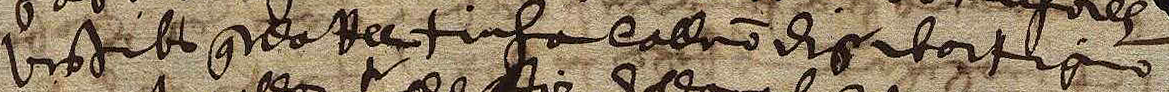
vestidos q̅ ella Ree tinha e all nō dise do artiguo
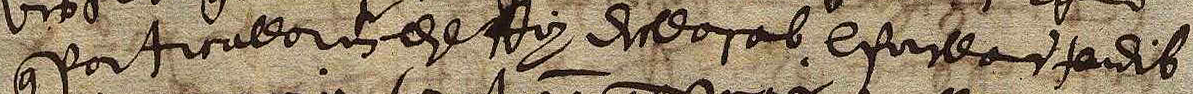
q̄ particullarmte lhe ffoy decllarado e por ella ētendido
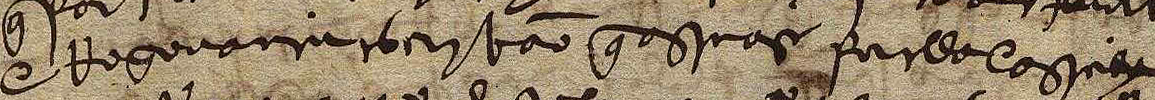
e Rogou a mim escryvão q̄ asjnase por ella e asjney
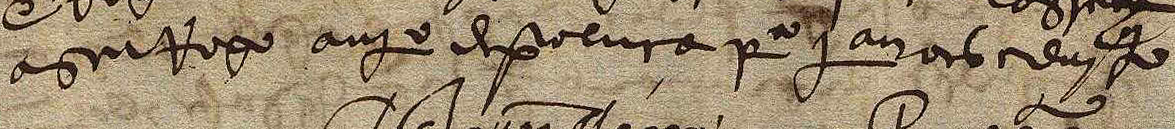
a seu Rogo anto de proença pco tam o escreuj
